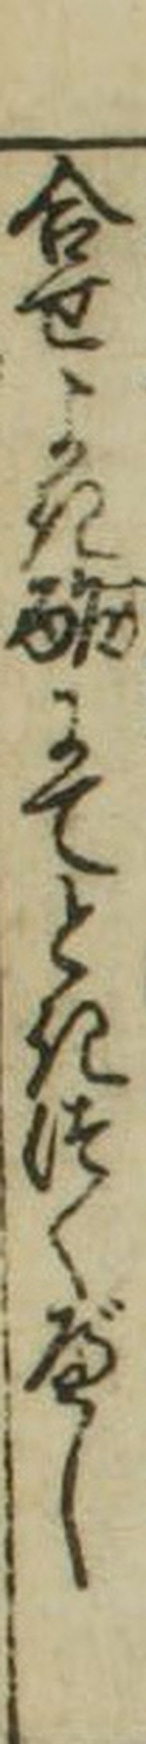合せよき酢にてときつくべし

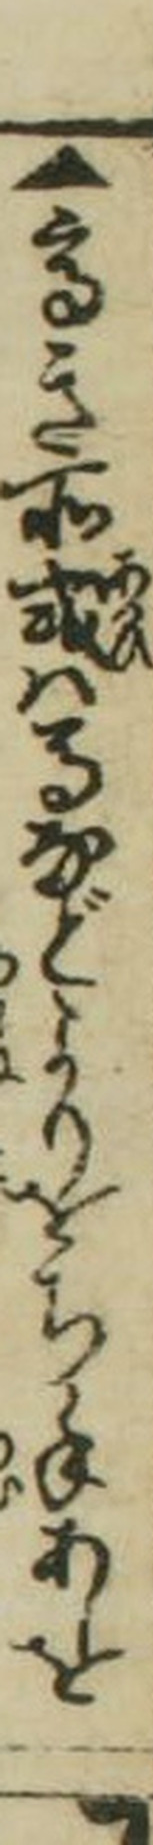▲高き所或は馬などよりをち手あしを
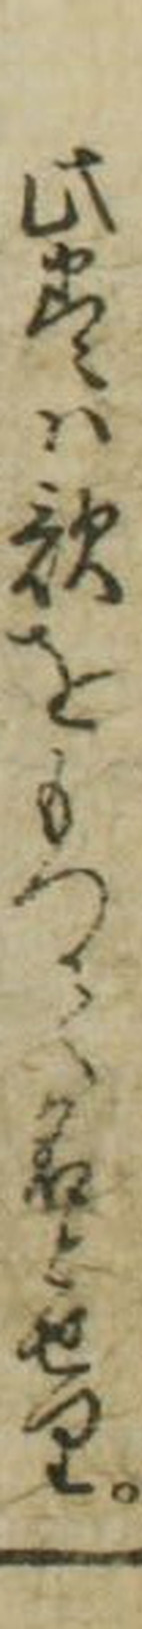此巻は歌をもつて名とせり。
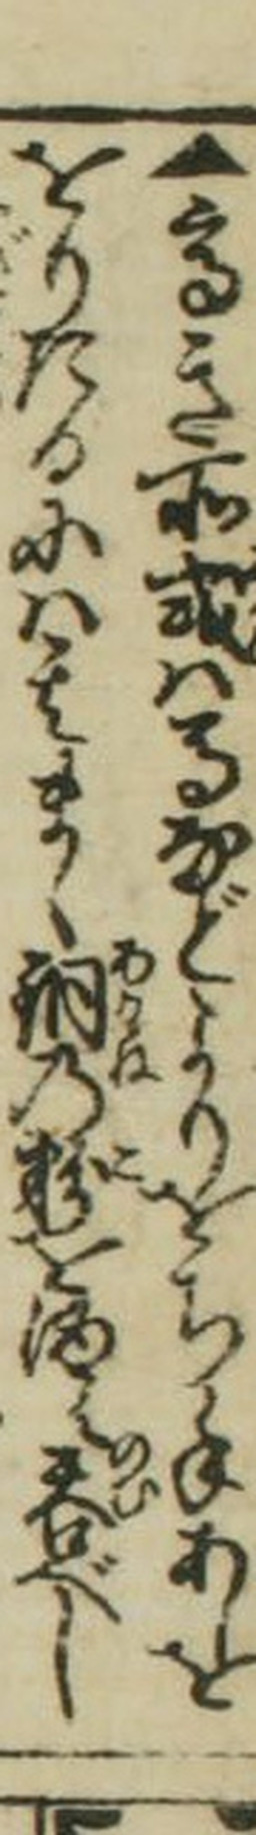をりたるには其まゝ銅の粉を酒にて呑べし
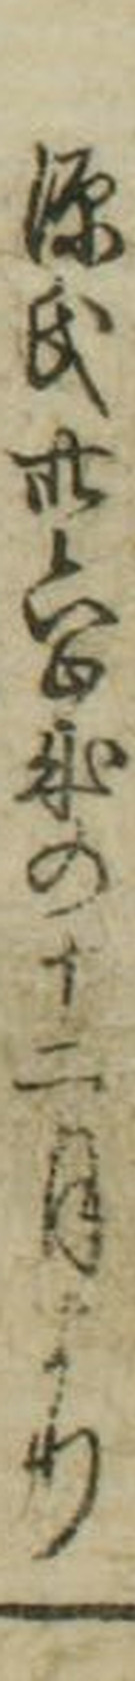源氏卅六歳の十二月より
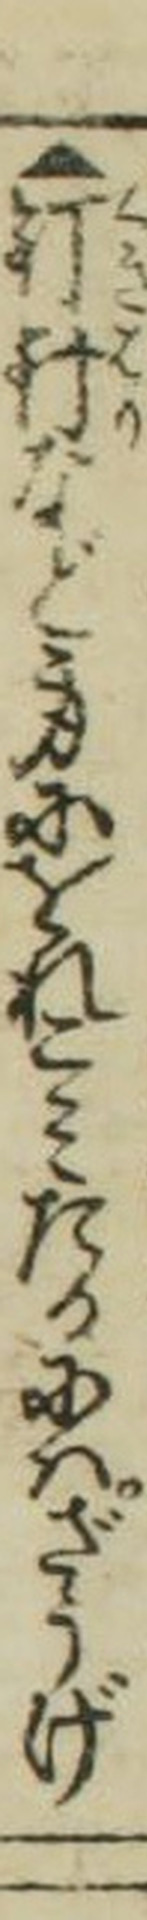▲釘針など身にをれこみたるには。ざうげ
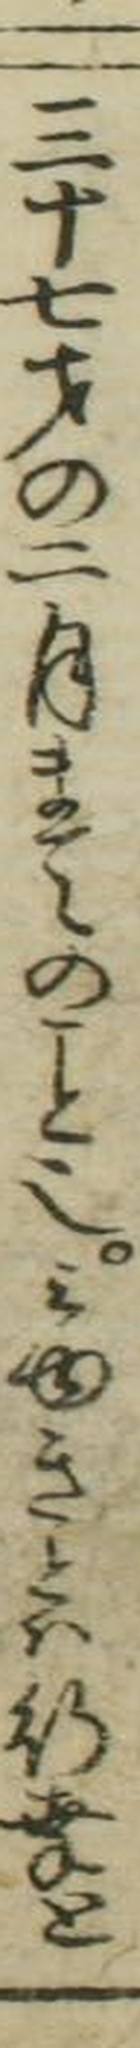三十七才の二月まてのこと也。みゆきとは行幸と
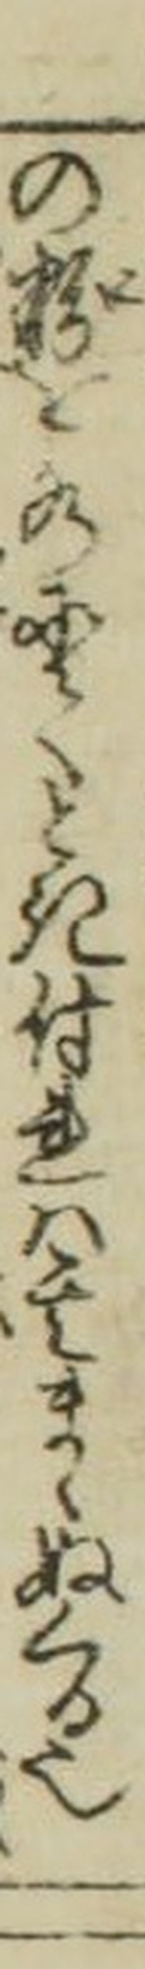の粉を水にてとき付れは其まゝぬくる也
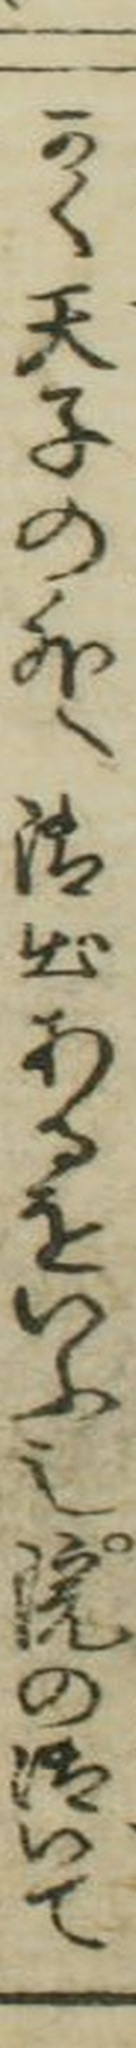かく天子の外へ御出あるをいふ也。院の御いて
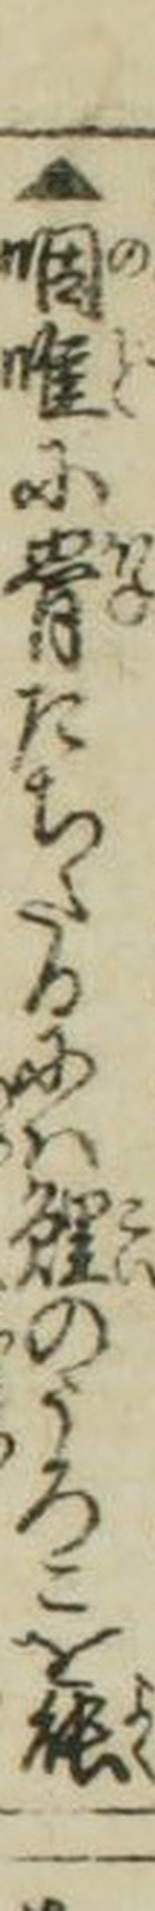▲咽喉に骨たちたるには鯉のうろこを能
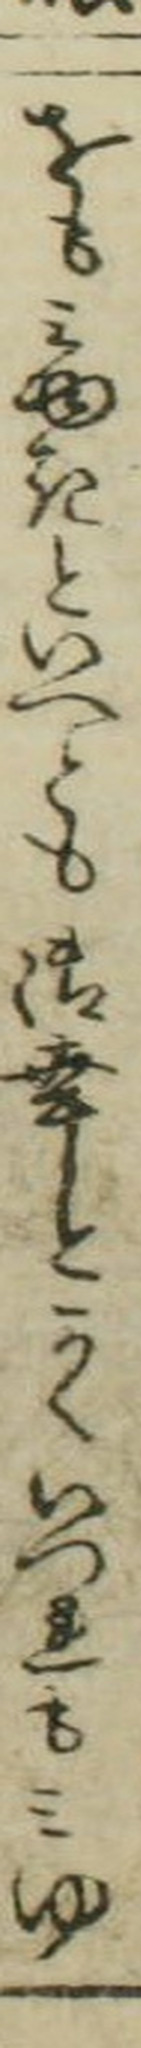をもみゆきといへとも御幸とかくいつれもみゆ
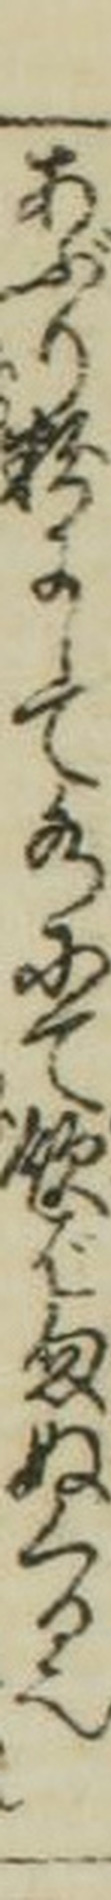あぶり粉にして水にて飲ば忽ぬくる也
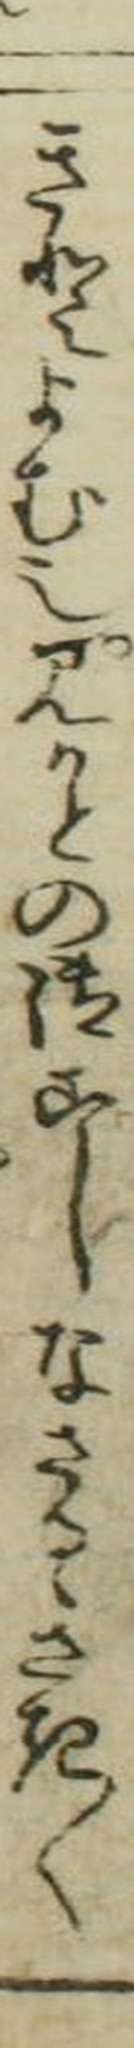きとよむ也。みかとの御こしなさるゝさき〳〵
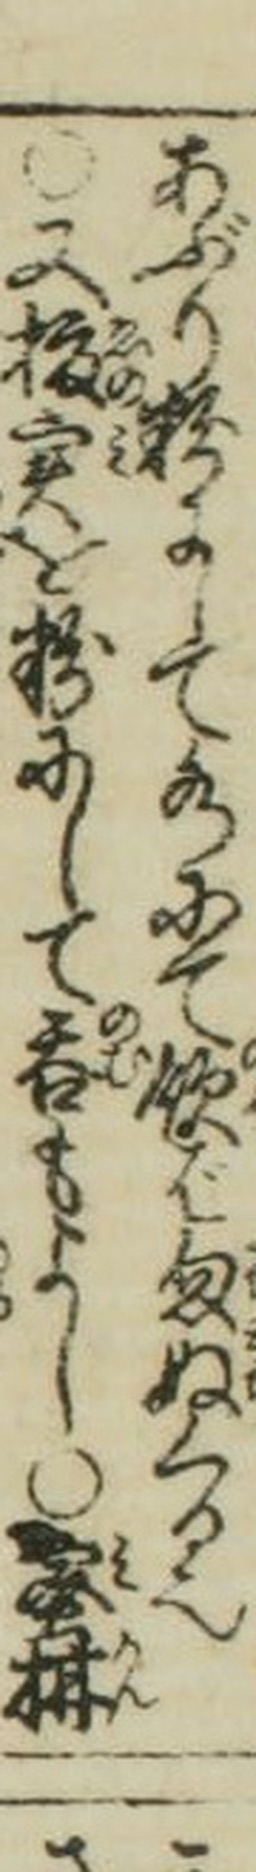◯又榎実を粉にして呑もよし◯蜜柑
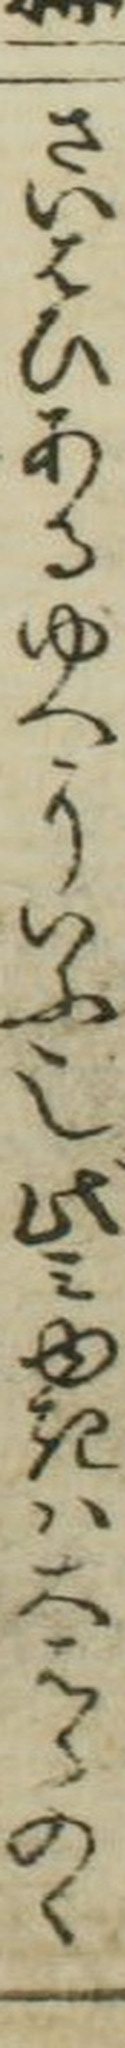さいはひあるゆへにいふ也。此みゆきは大はらのゝ
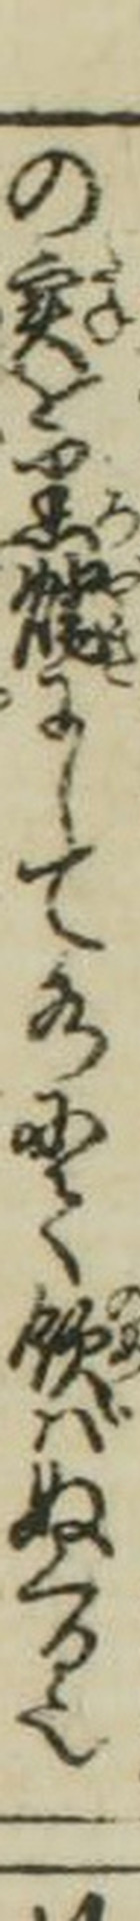の実を黒焼にして水にて飲ばぬくる也
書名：女源氏教訓鑑
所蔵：東京学芸大学附属図書館
